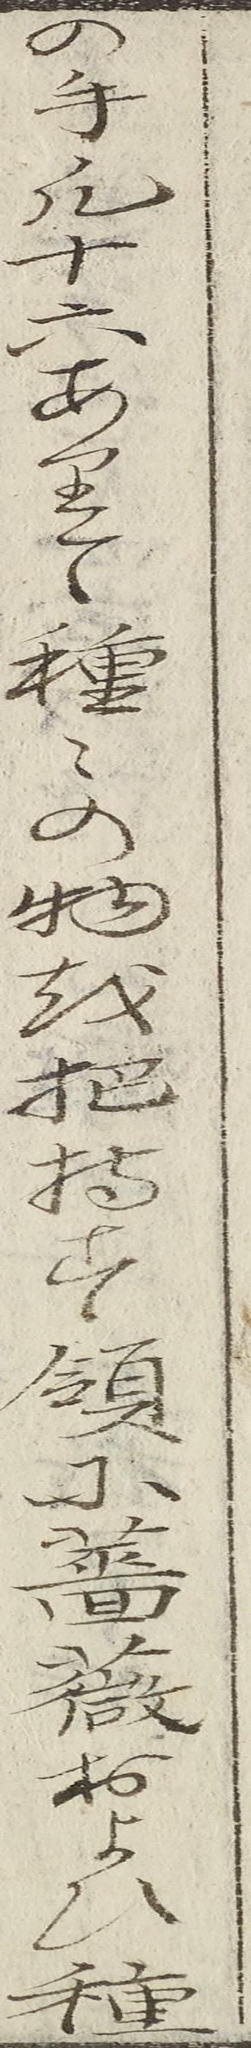の手凡十六ありて種々の物を把持す領に薔薇およひ種
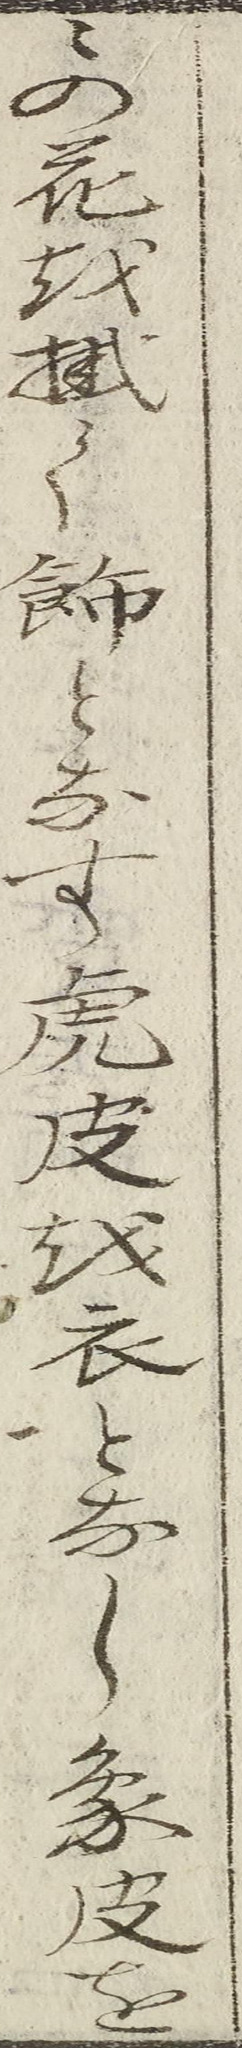々の花を掛て飾となす虎皮を衣となし象皮を
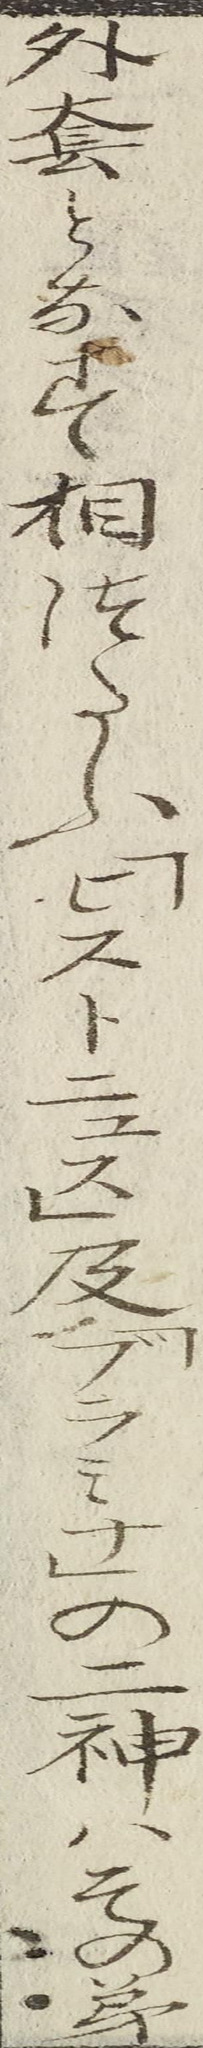外套となす相つたふ「ヒスト二ュス」及「ブラミナ」の二神はその弟
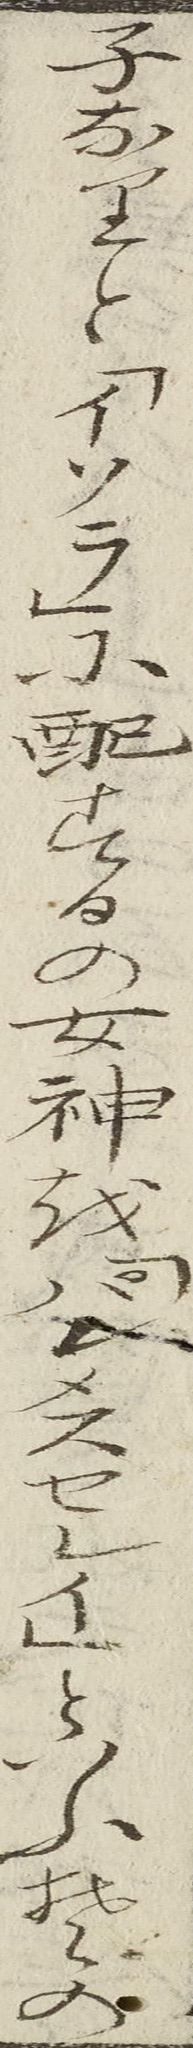子なりと「イソラ」に配するの女神を「パレメスセレイ」といふその
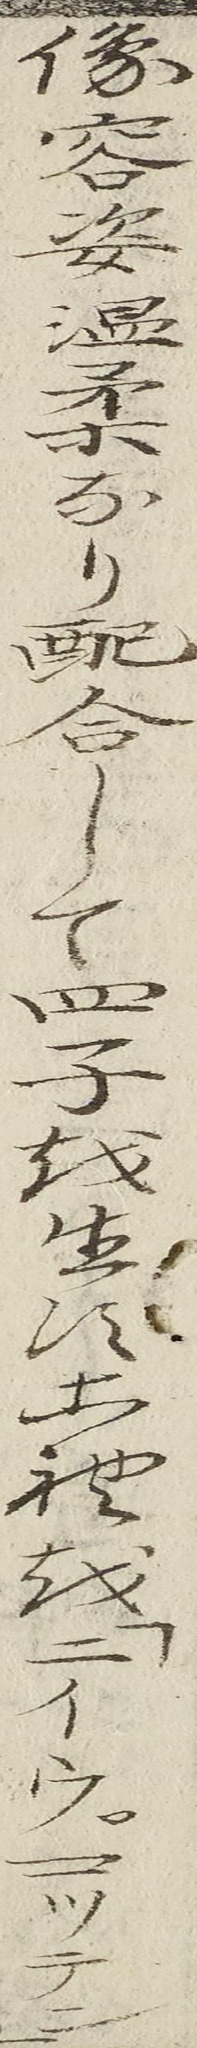像容姿温柔なり配合して四子を生すこれを「二イウ。コツテン」
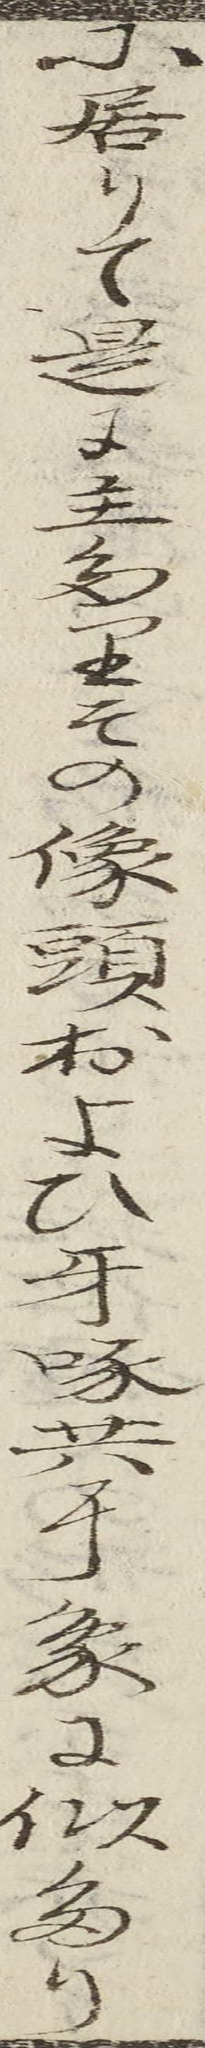に居りて是に主たりその像頭およひ牙啄共に象に似たり
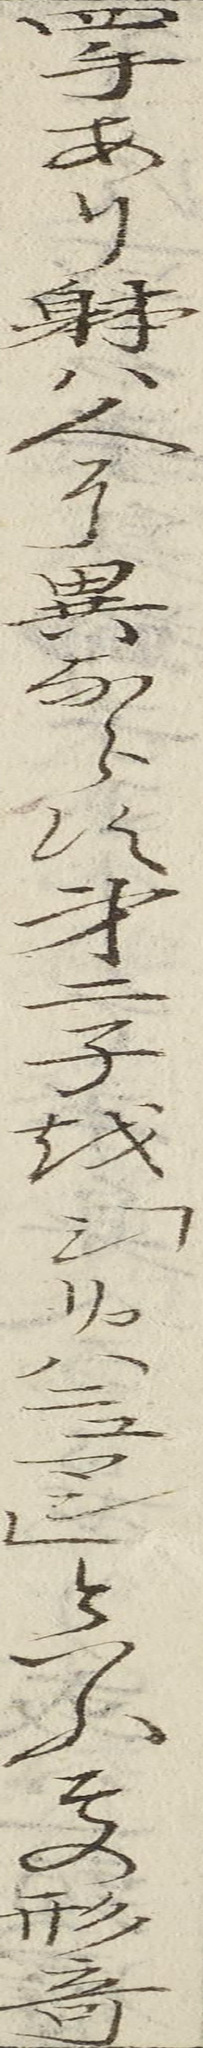四手あり体ハ人に異ならす第二子を「シリ。ハ二ュマン」といふその形奇
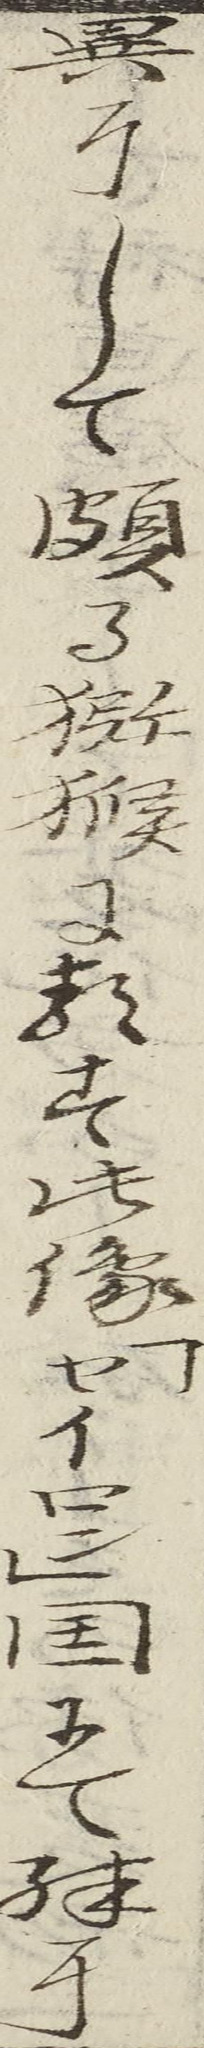異にして頗る獅に類す此像「セイロン」国にて殊に
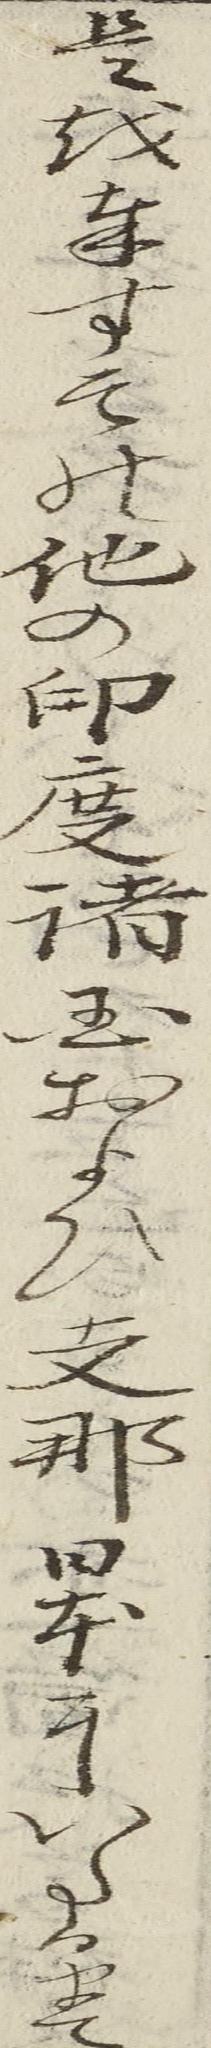是を奉すその他の印度諸国およひ支那日本にいたるまて
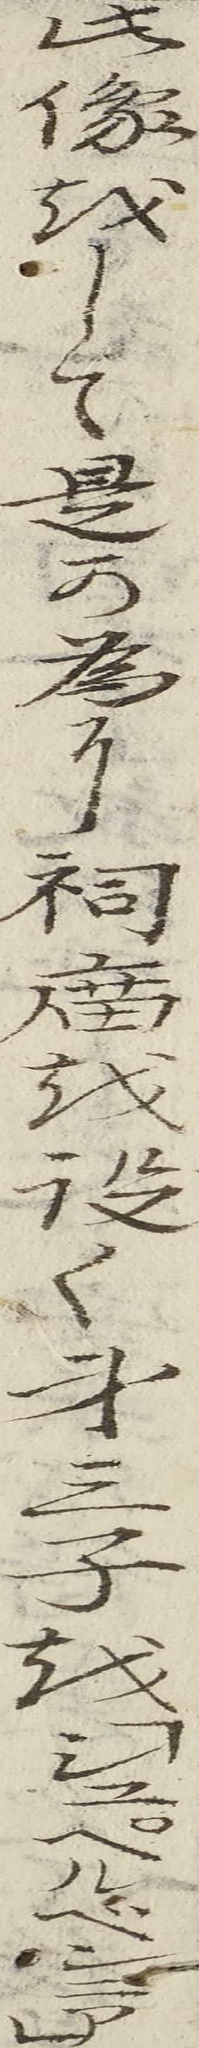此像をして是か為に祠庿を設く第三子を「シュ。ヘルべン二ア」
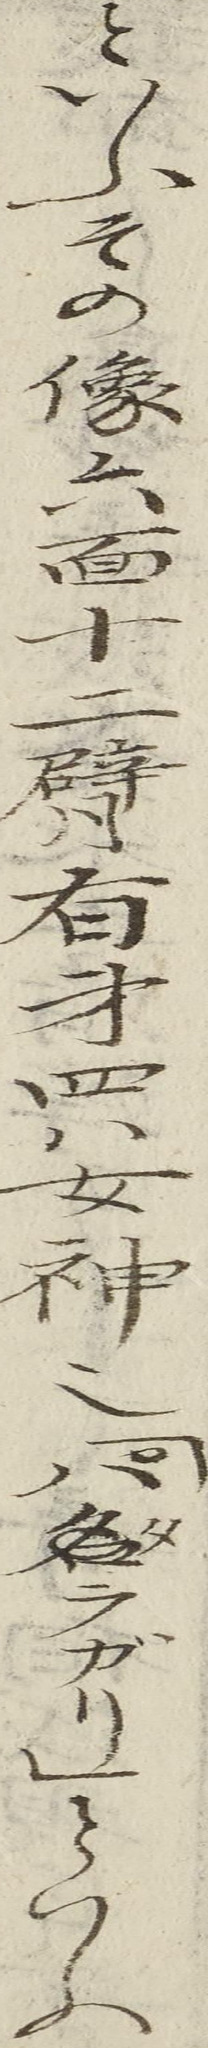といふその像六面十二丕臂有第四ハ女神也「パタラガリ」といふ
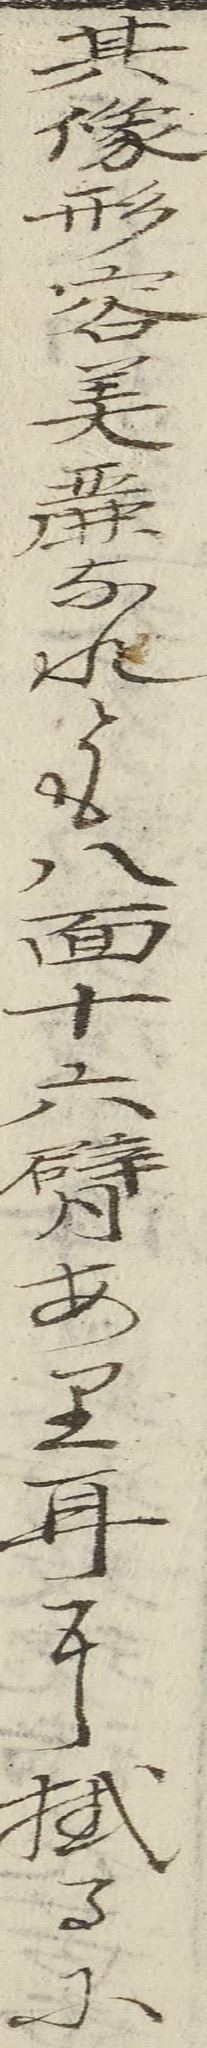その像形容美麗なれとも八面十六臂あり耳に掛るに
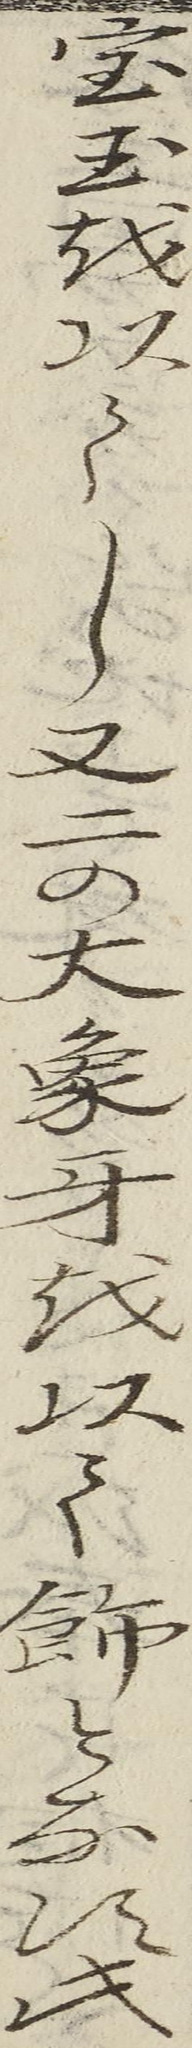宝玉を以てし又二の大象牙を以て飾となす此

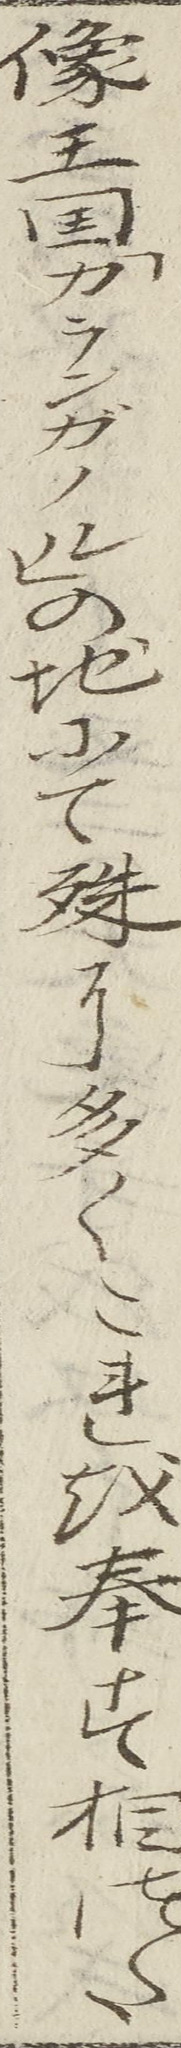像王国「カランガノル」の地にて殊に多くこれを奉す相つた
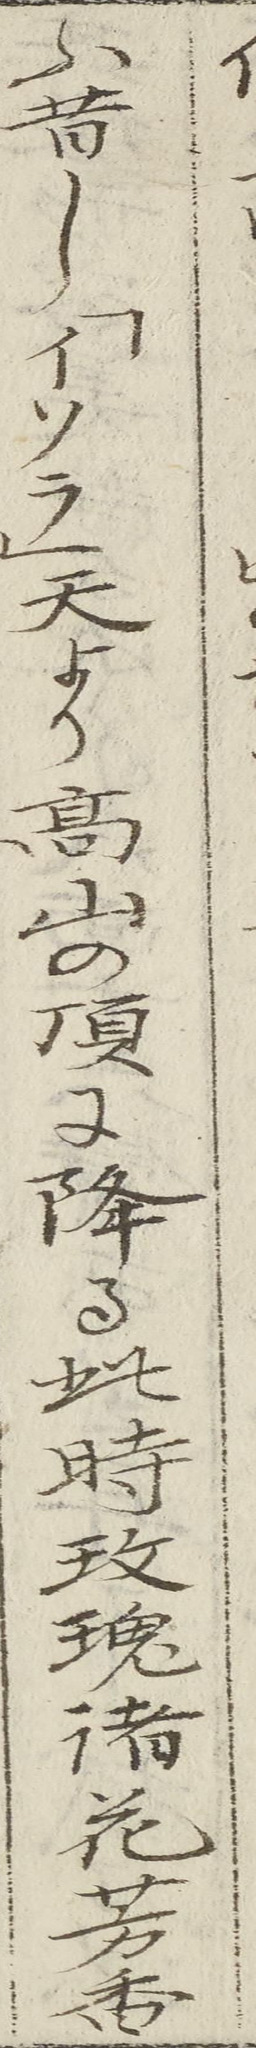ふ昔し「イソラ」天より高山の頂に降る此時玖瑰諸花芳香
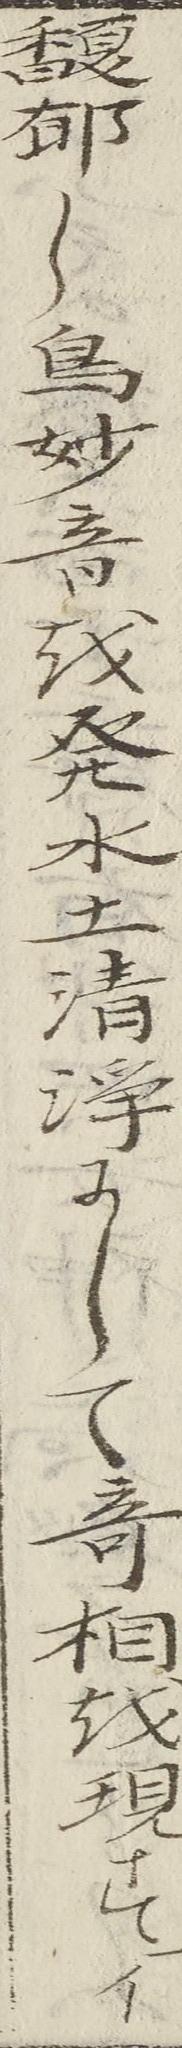馥郁し鳥妙音を発水土清浄にして奇相を現す「イ
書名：西洋雜記　坤
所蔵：東京大学地震研究所図書室 Earthquake Research Institute Library, The University of Tokyo, JAPAN
